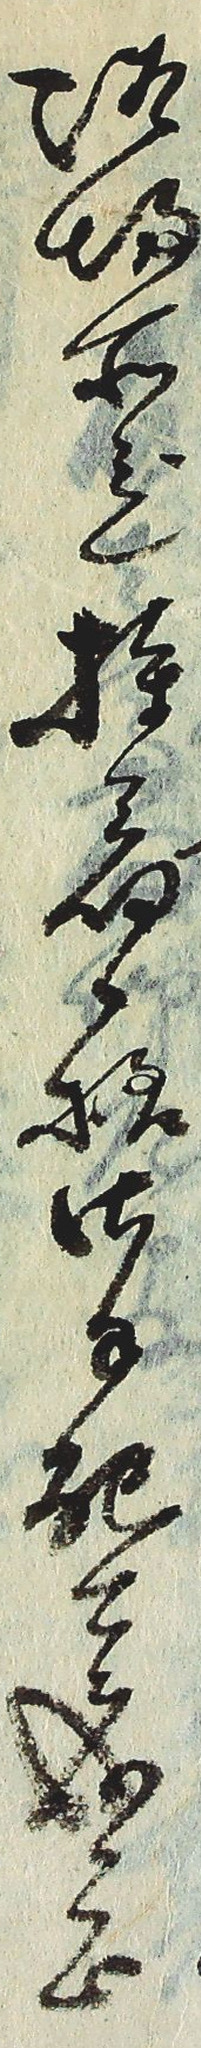御場所迄持着候様御手配可被成候以上
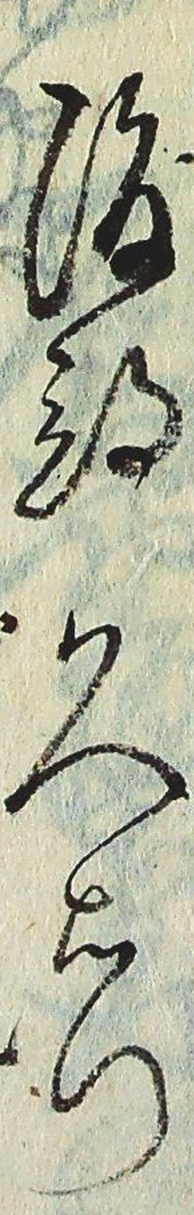渡部久右衛門
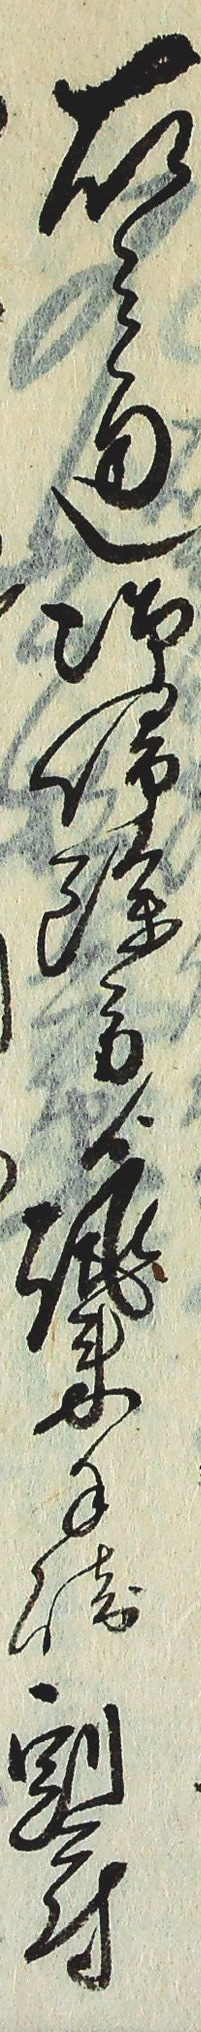右之通御掃除方ゟ誂来手崎割苻
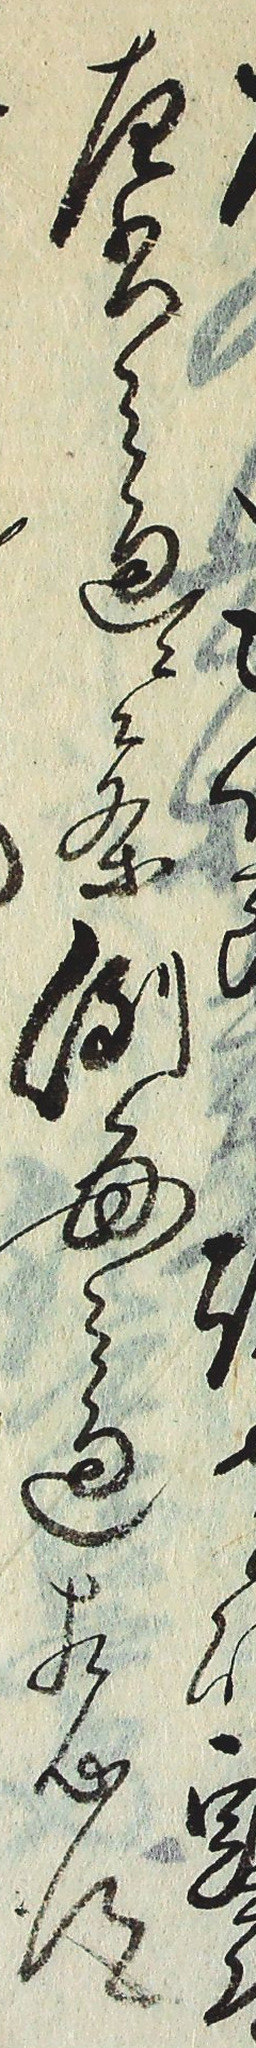左書之通に候条例毎之通相心得
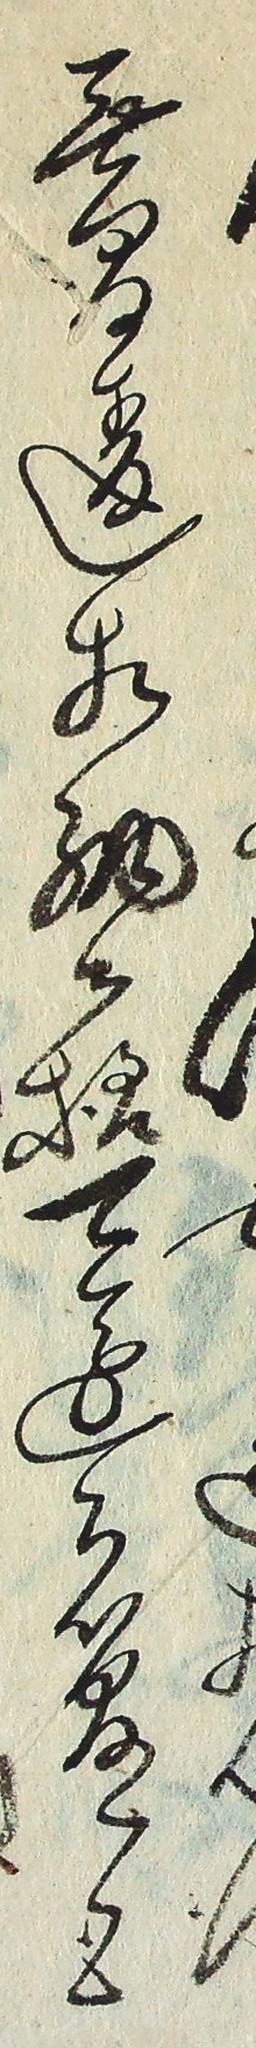無間違相納候様可遂了簡候以上

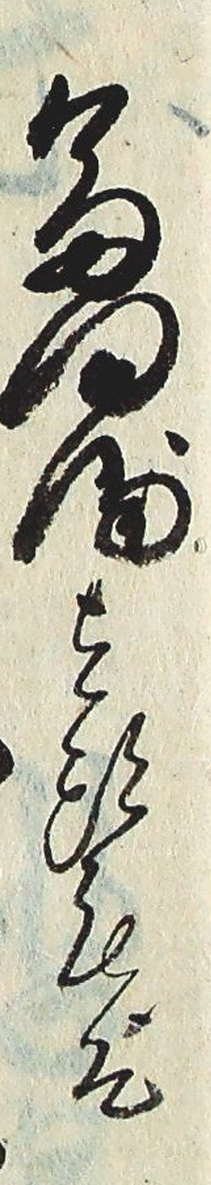冨田浦与頭庄屋
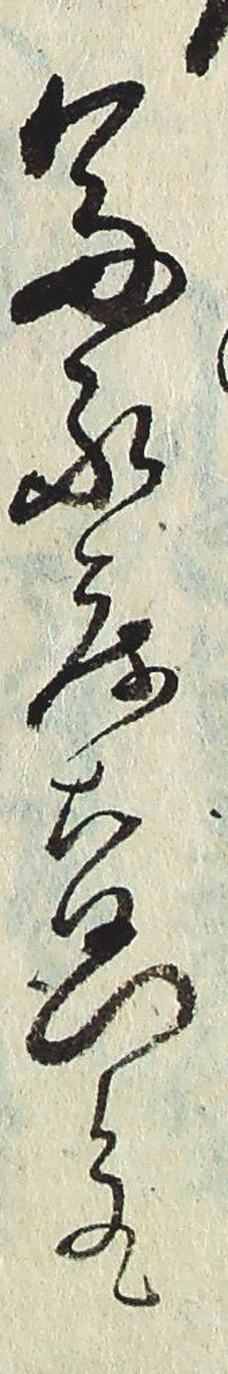富永茂右衛門方へ
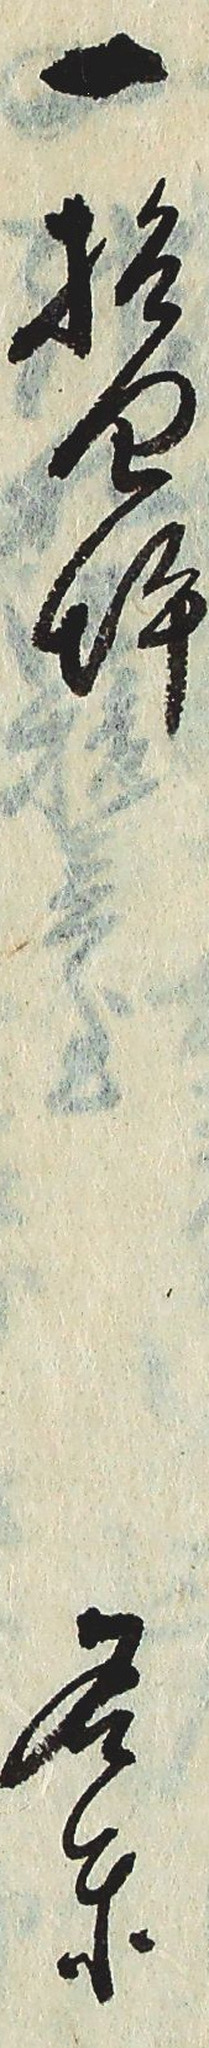一拾四坪名東
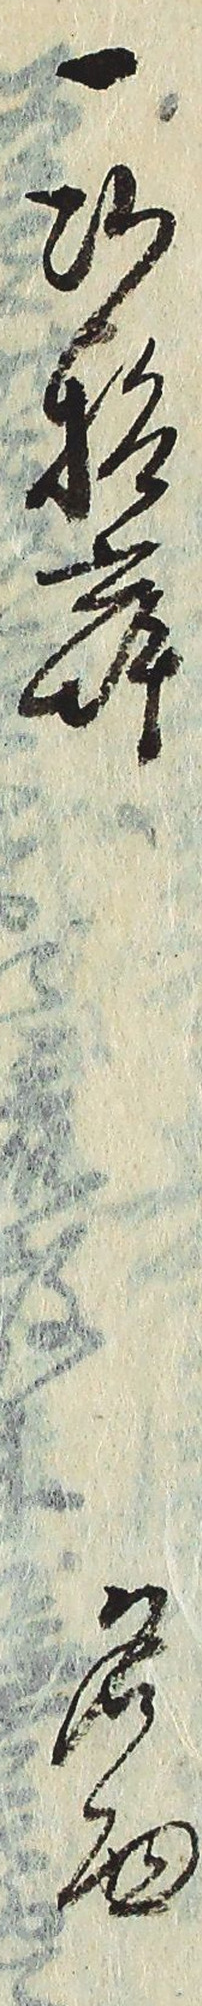一弐拾六坪名西
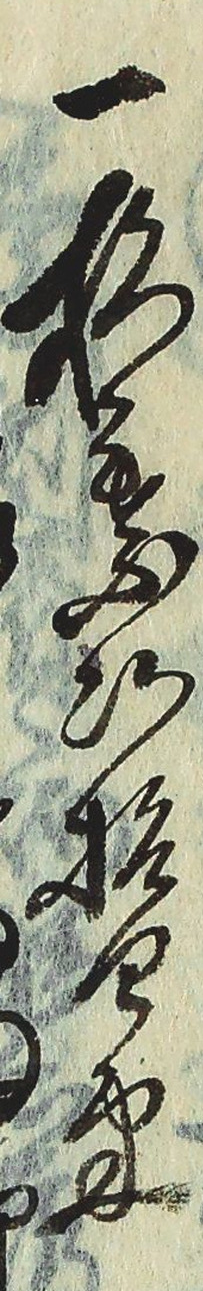一松葉弐拾四束
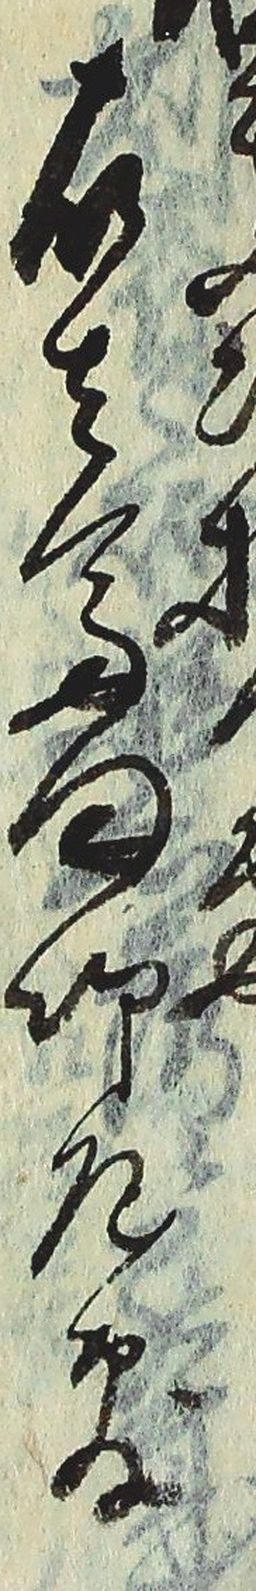右は富田御屋敷
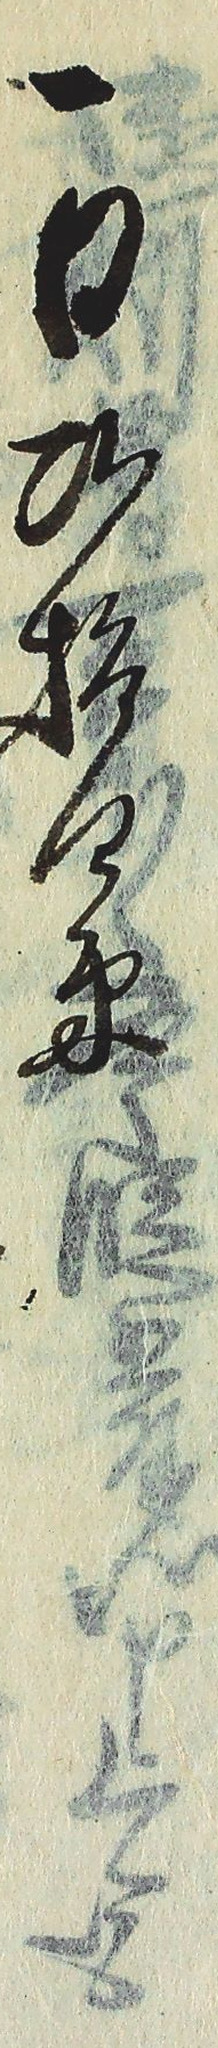一同弐拾四束
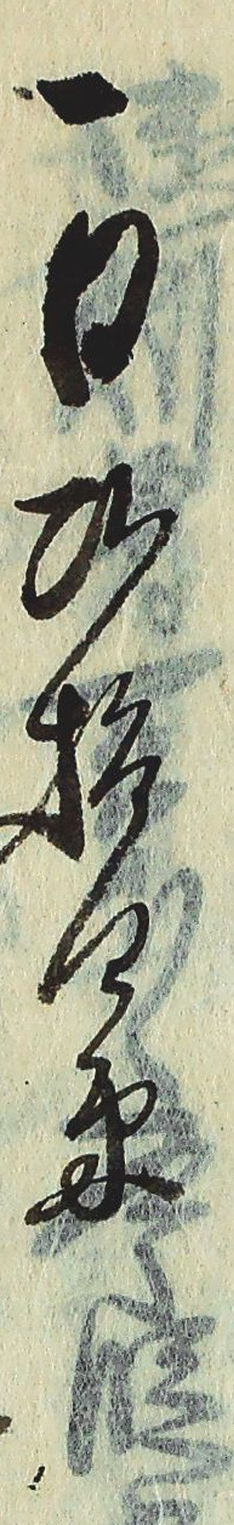一同弐拾四束
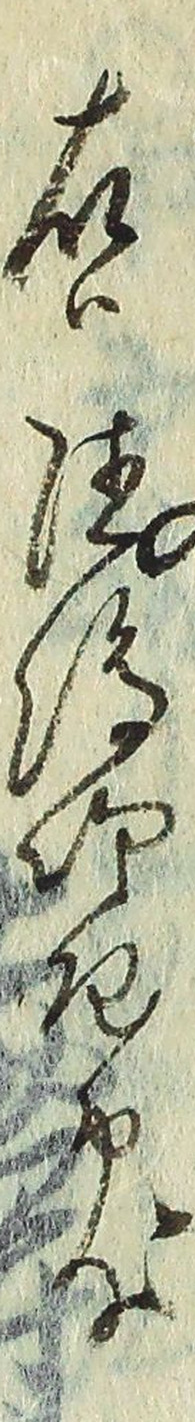右は徳島御屋敷
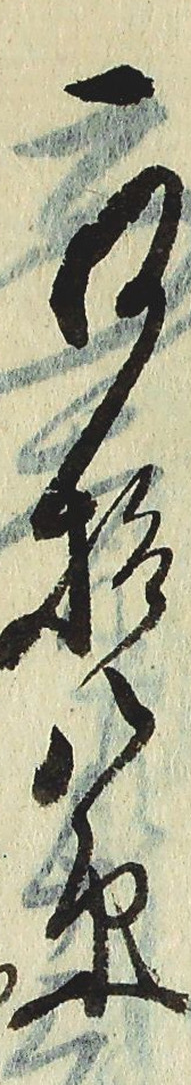一同拾八束
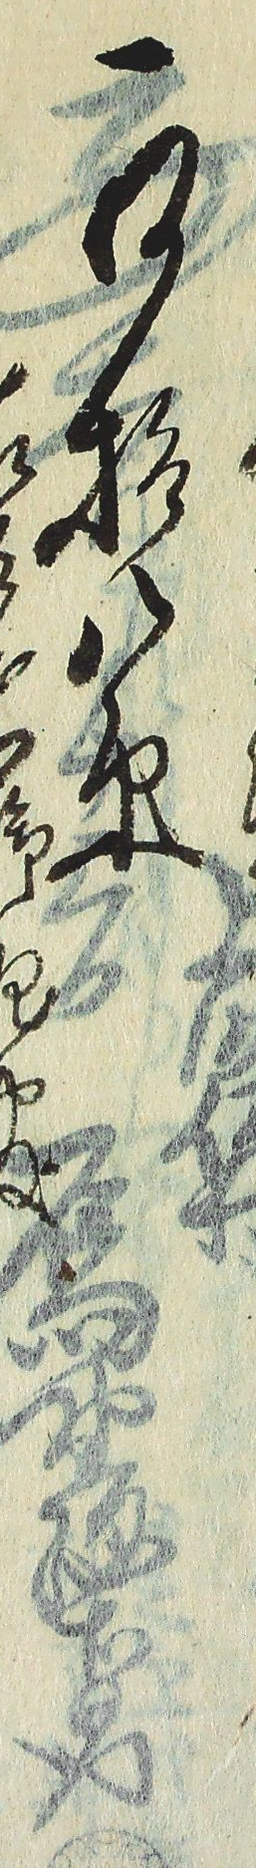一同拾八束
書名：名東郡中諸割賦元帳
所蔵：鳴門教育大学 Naruto University of Education
